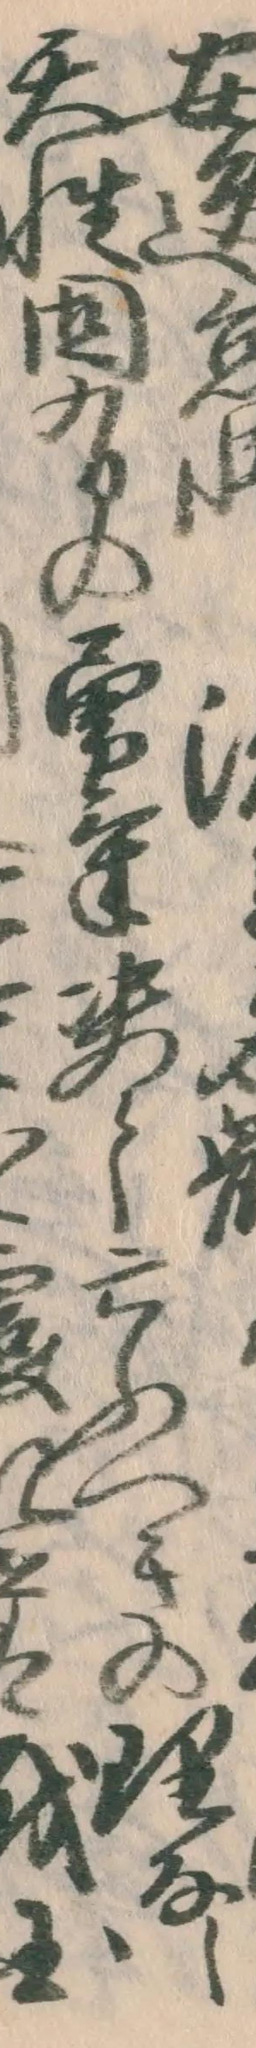天性固有の勇氣決て亡ふへきの理なし
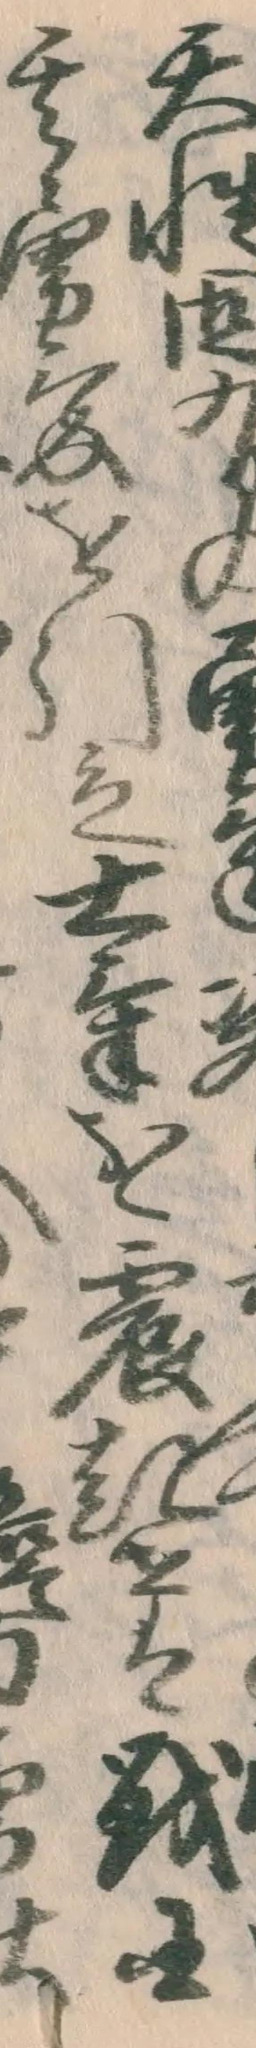其勇氣を引立士氣を震起せは戦国
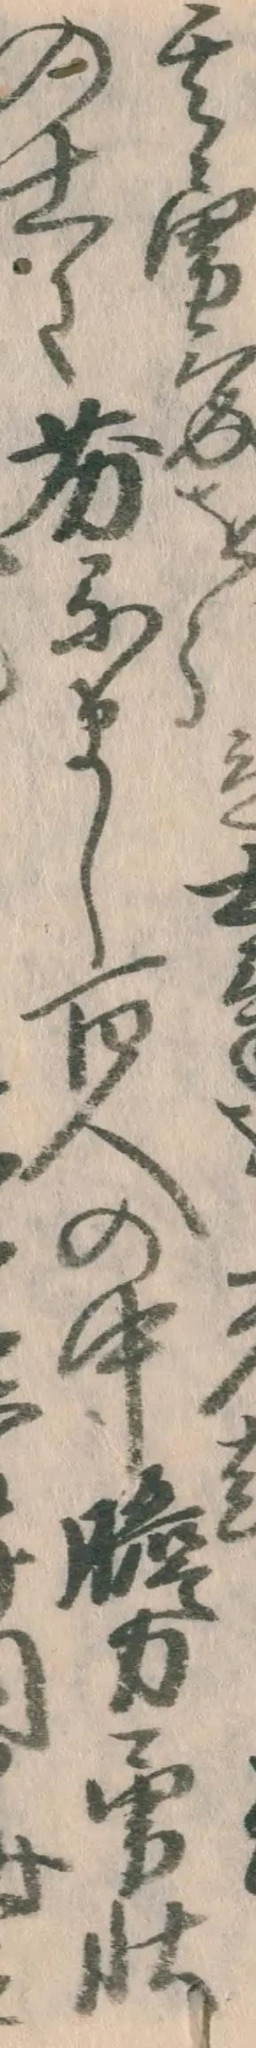の士に劣るまし百人の中膽力勇壮
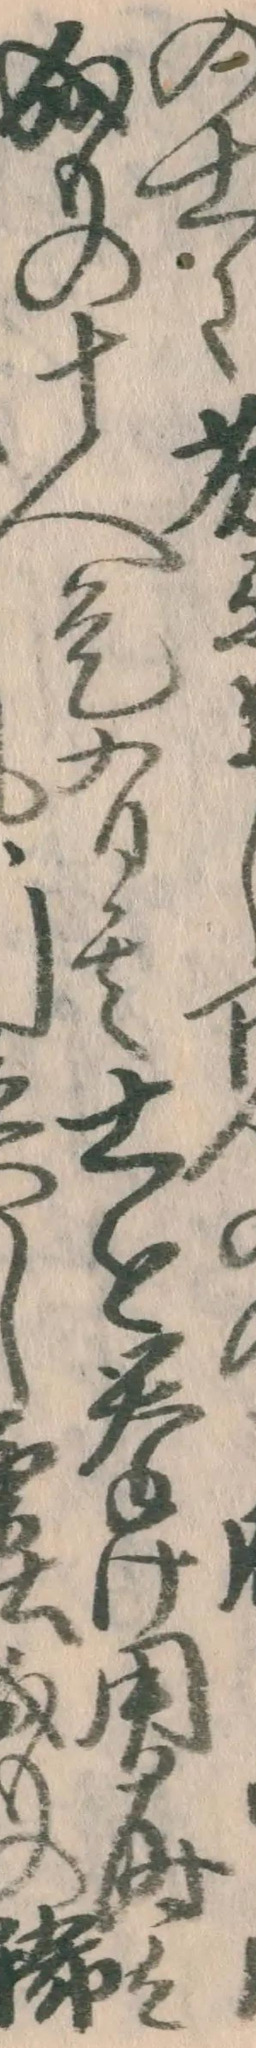成もの十人是有其士を挙け用る時は
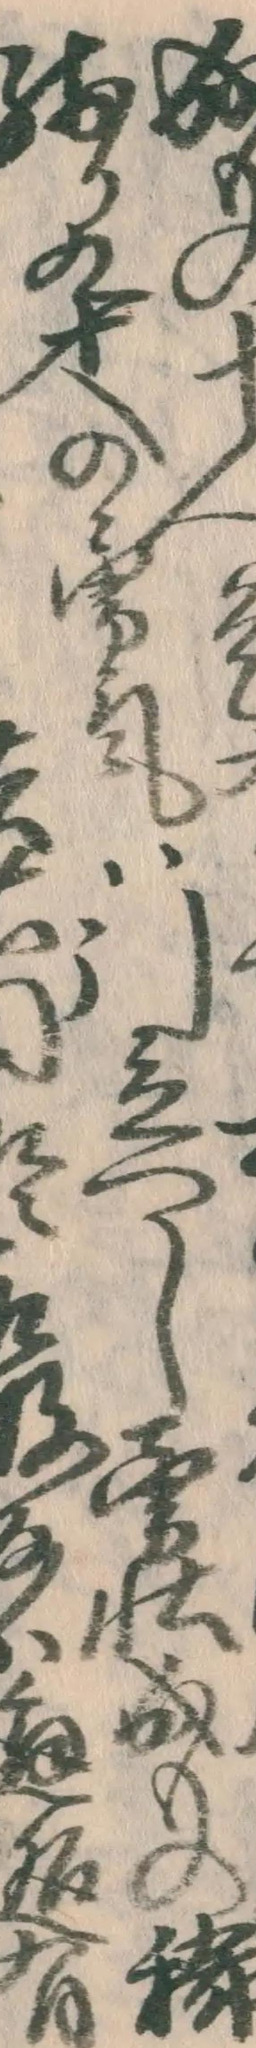残り九十人の勇氣ハ引立へし勇壮成もの稀
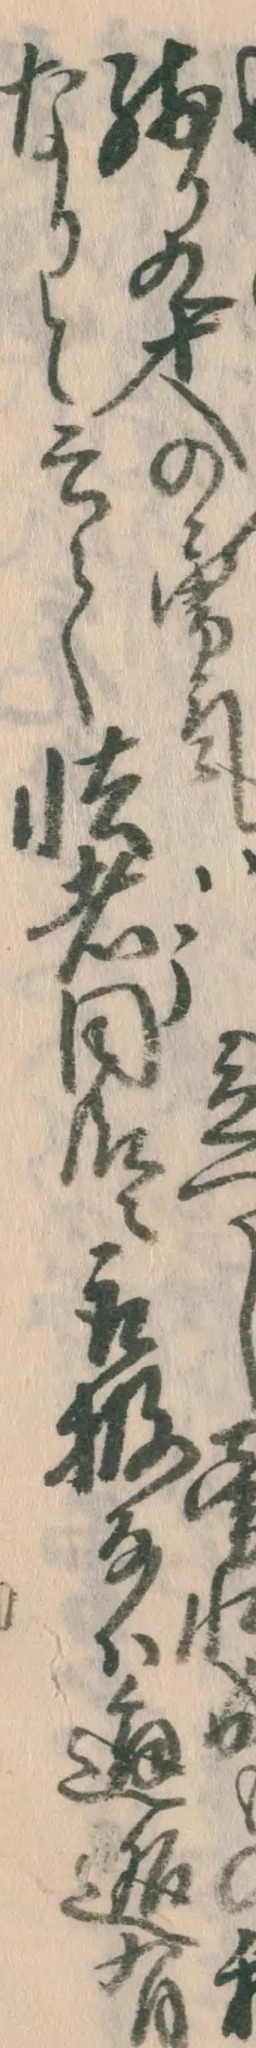なりと云て怯者同様ニ取扱なハ邂逅有
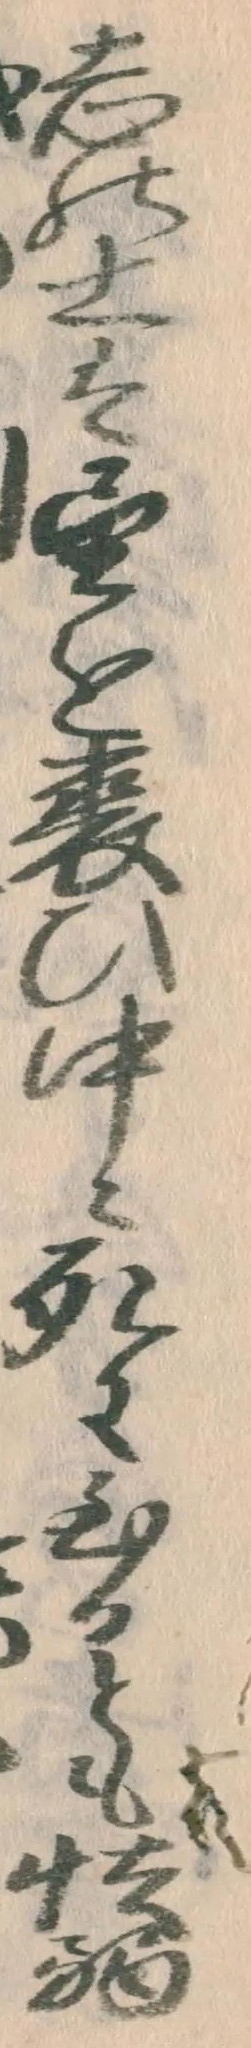志の士は望を喪ひ中ニ死に至るとも怯弱
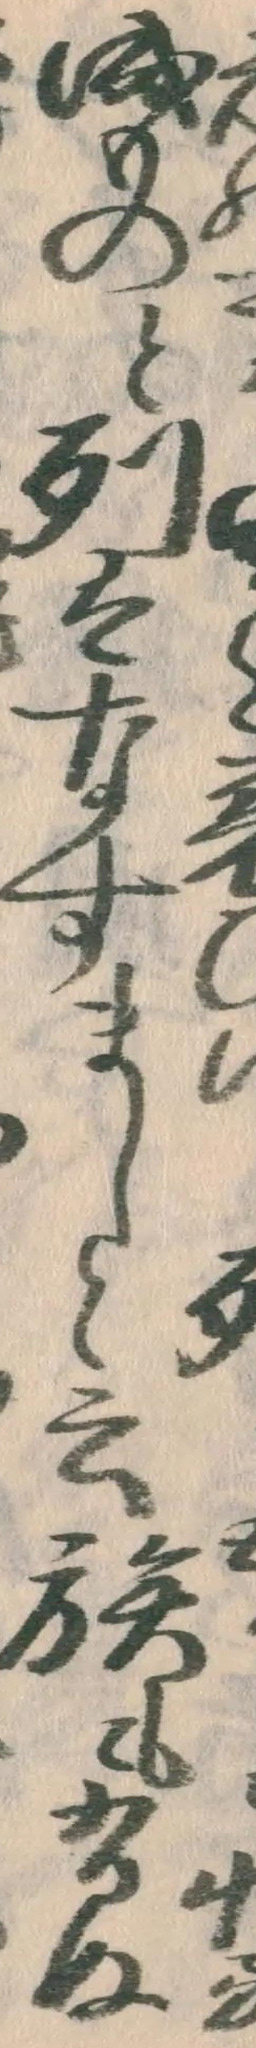成ものと列はなすましと云族も有ぬ
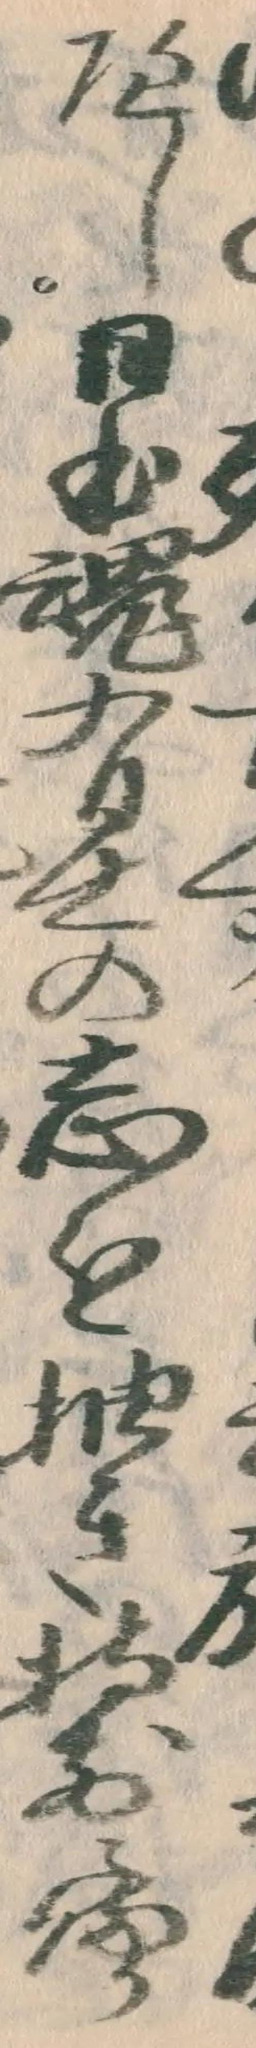へし日本魂有士の志を抽き持前ニ備り
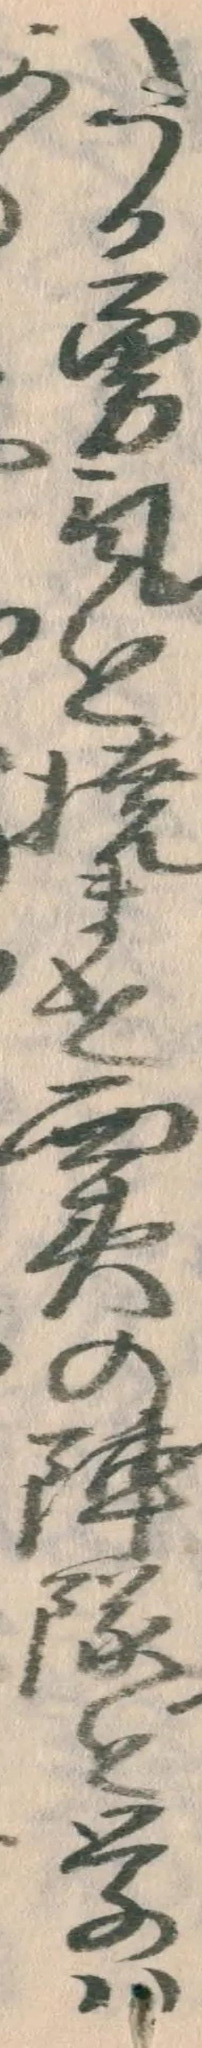たる勇気を撓ませ西夷の陣隊を学ハ
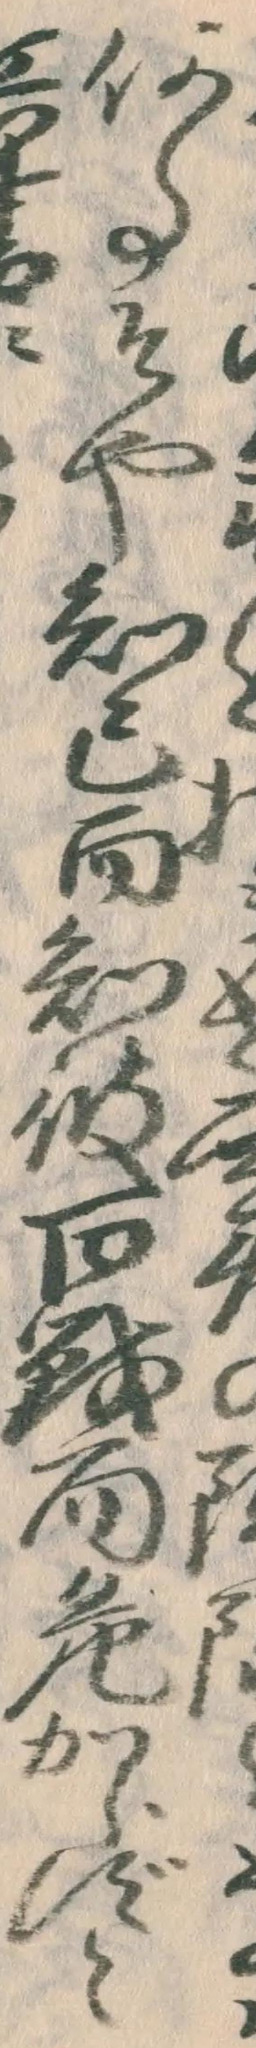何事そや知己而知彼百戦而危からずと
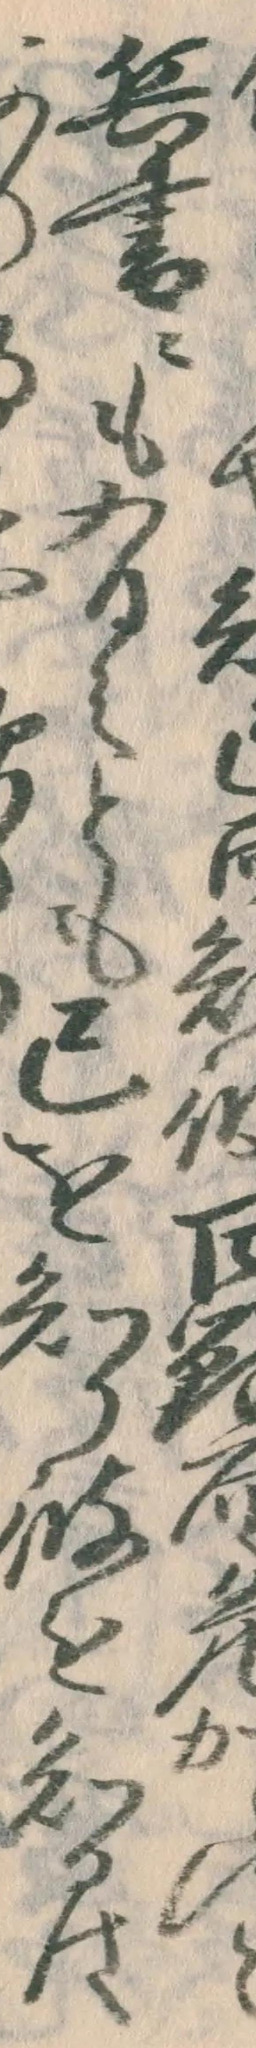兵書ニも有之とも己を知り彼を知るは
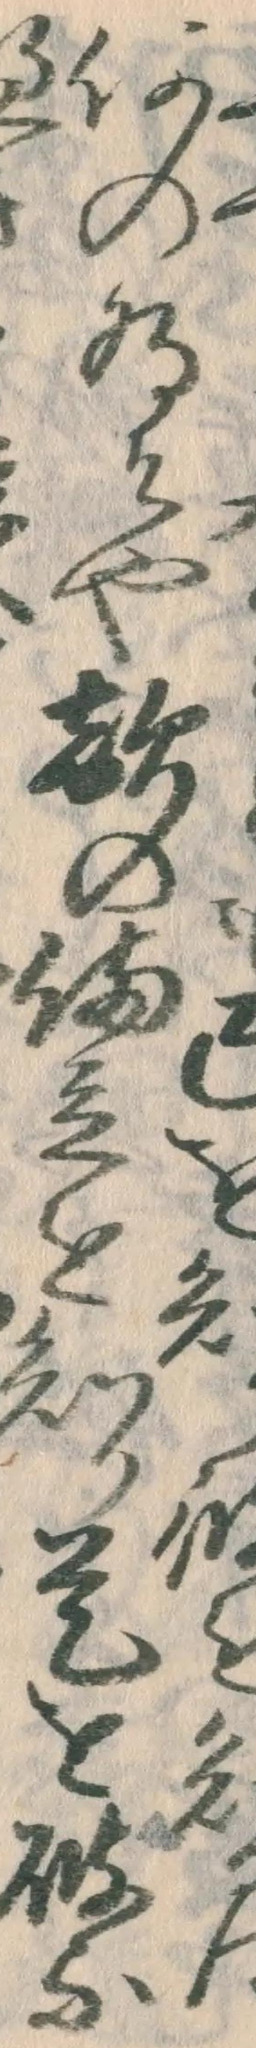何の為そや敵の備立を知り是を破る
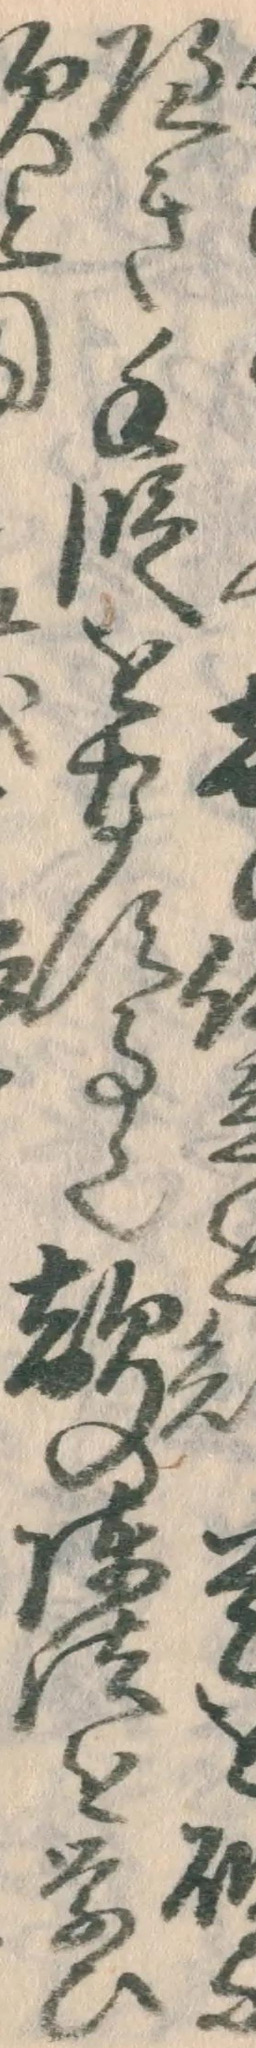へき手段をなす事也敵の陣法を学ひ
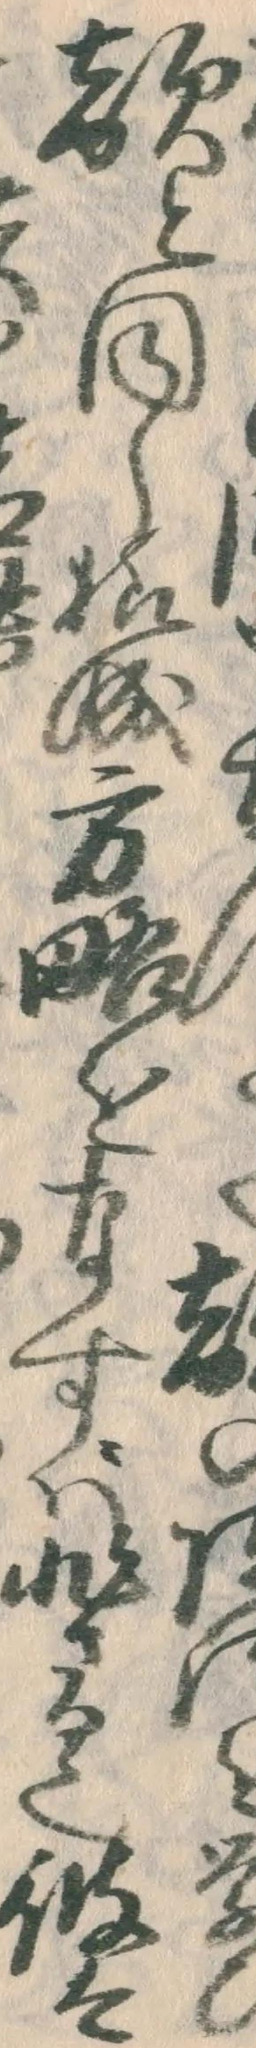敵と同し様成方略をなすニハ非さる也彼は
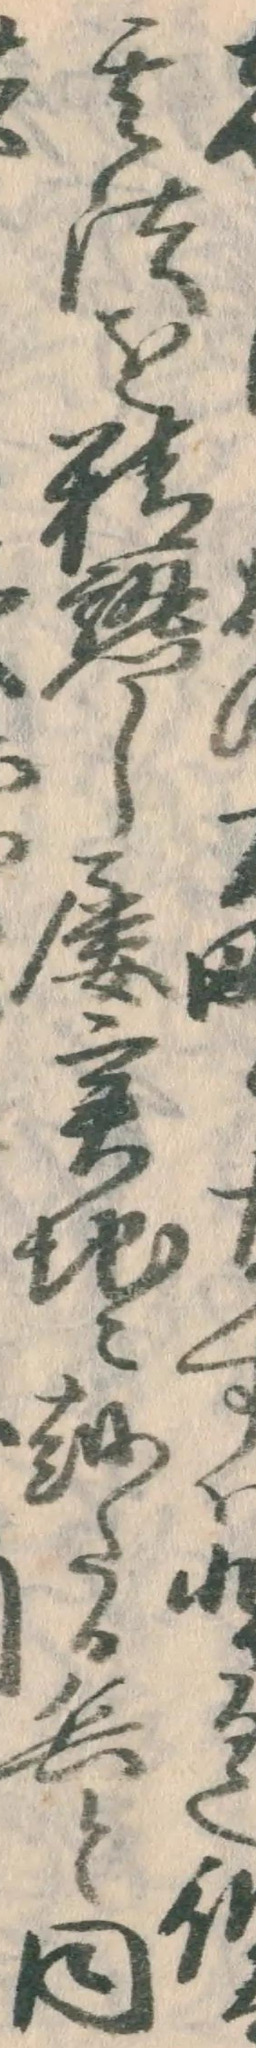其法を精熟し屡実地ニ越たる兵と同
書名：麗斎叢書. 20
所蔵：国立国会図書館 National Diet Library, JAPAN
